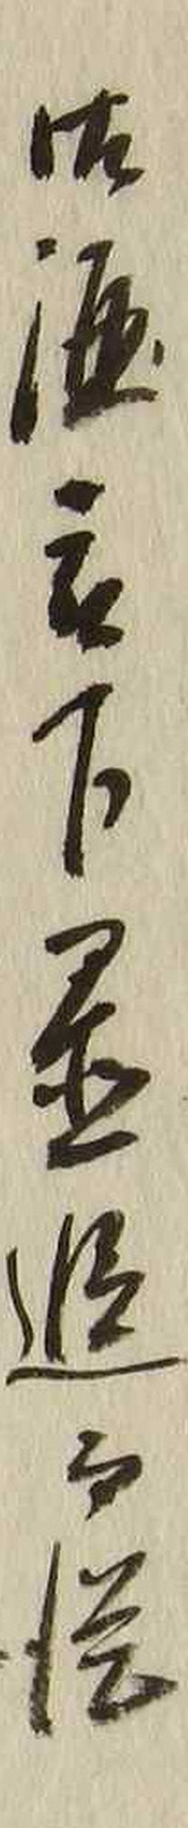御酒被下置追而従
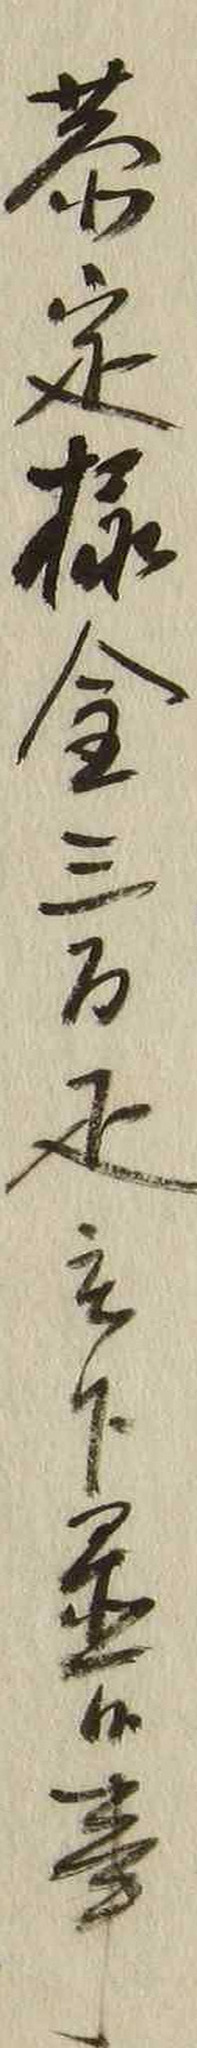恭定様金三百疋被下置候事
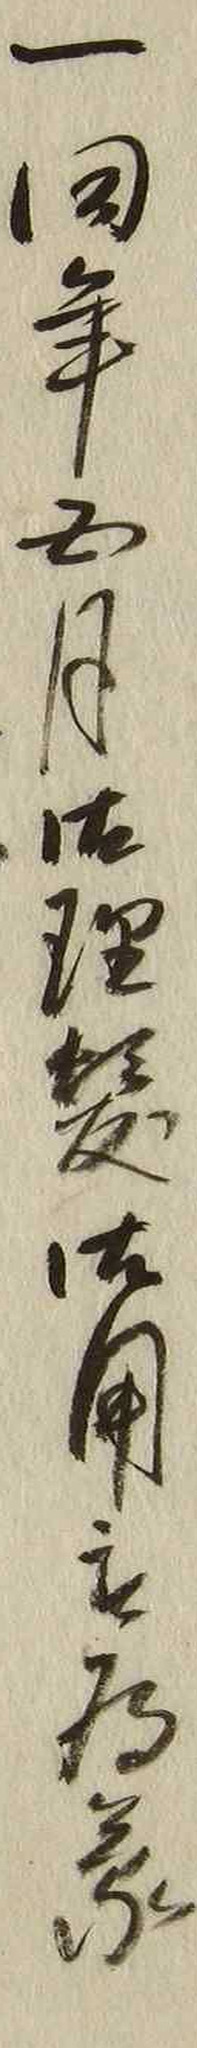一同年五月御理髪御用被為蒙
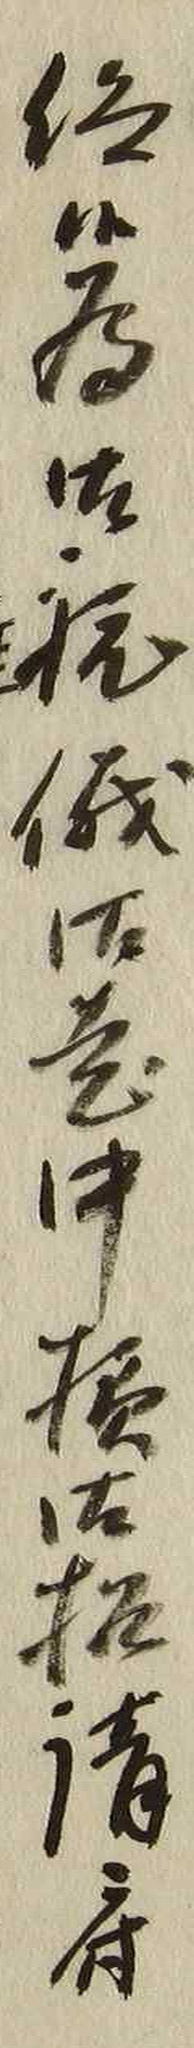仰候為御祝儀御老中様御招請に付
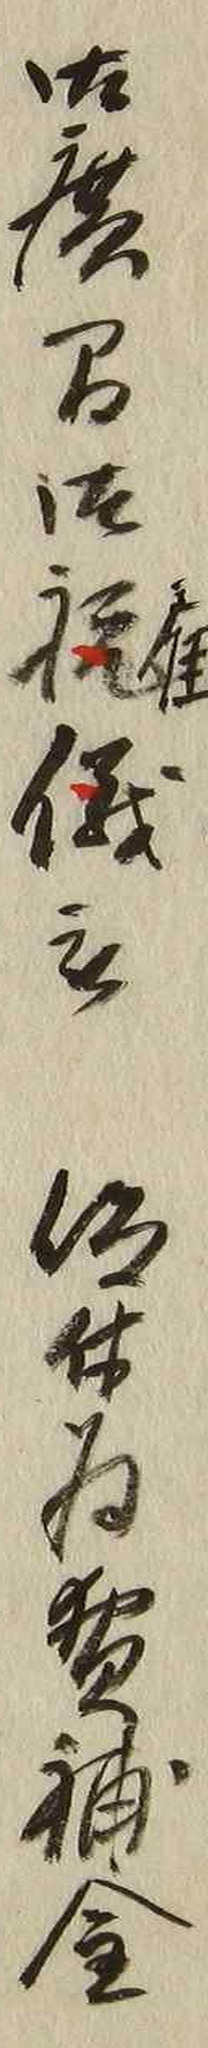御広間御祝儀被仰付為賛補金
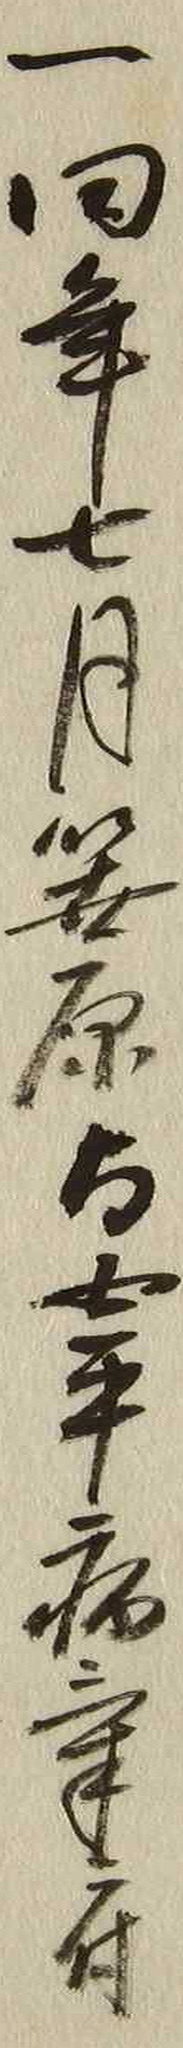一同年七月笹原与五平病気に付
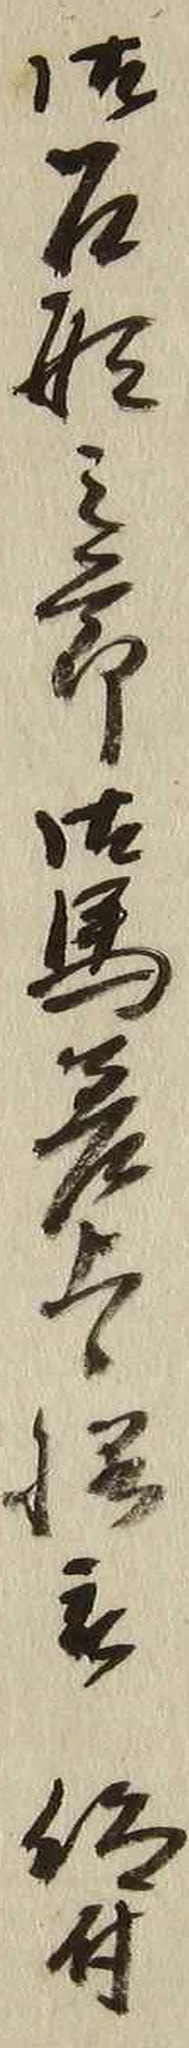御召形之節御馬差上候様被仰付
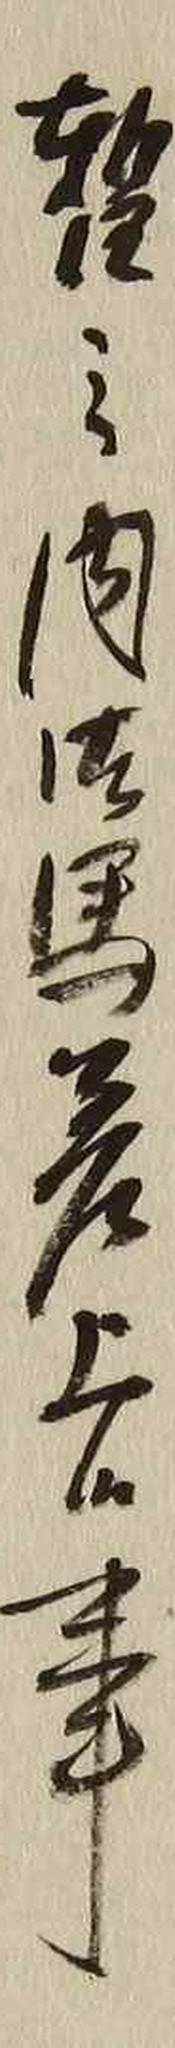暫之内御馬差上候事
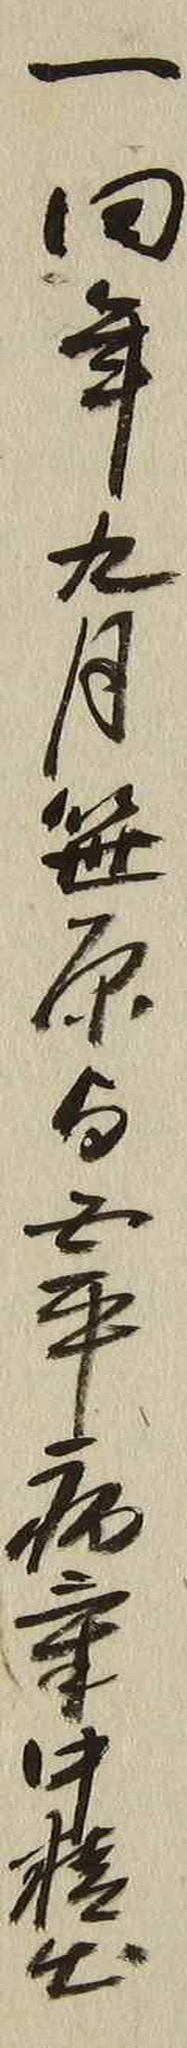一同年九月笹原与五平病気中精出
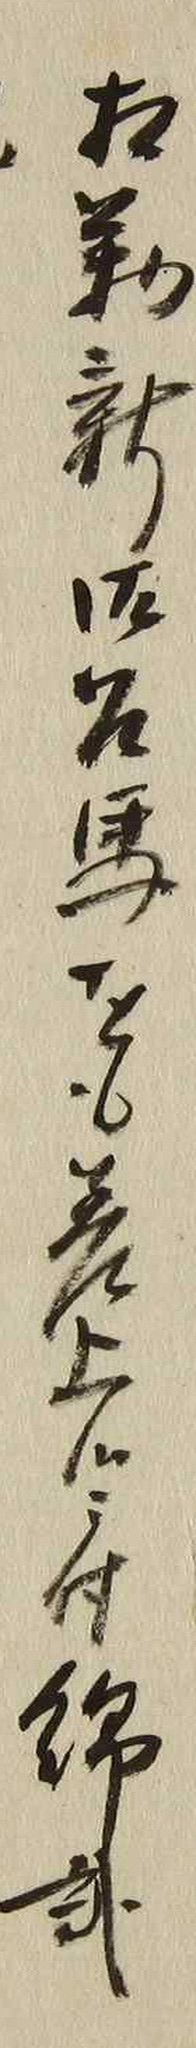相勤新御召馬をも差上候に付綿弐
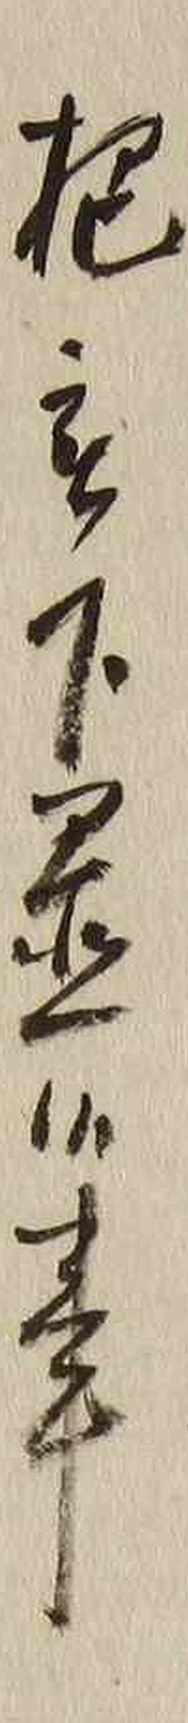把被下置候事
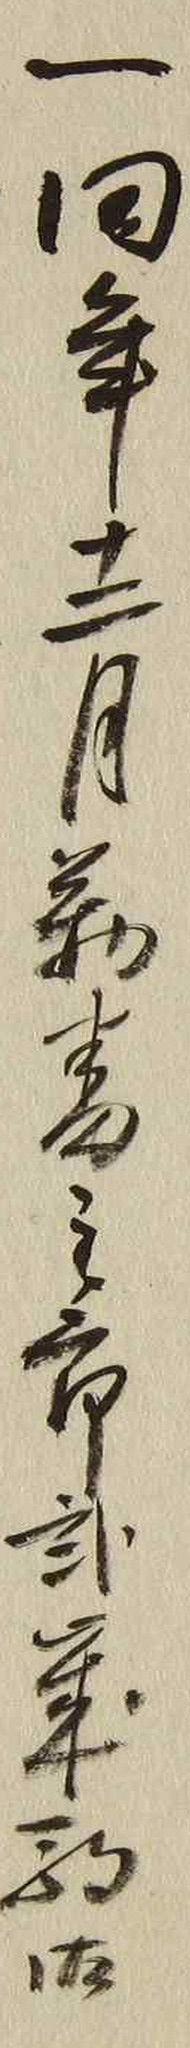一同年十二月勤番之節弐歳駒御
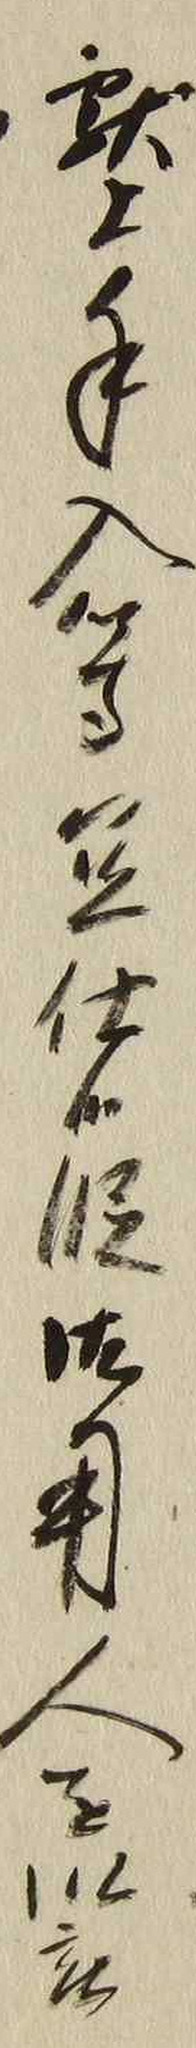献上手入等宜仕候段御用人を以被
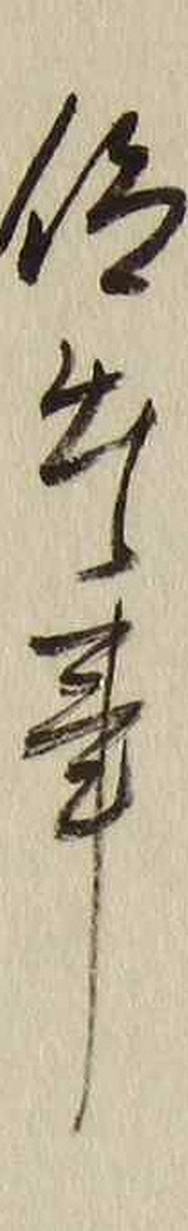仰出候事
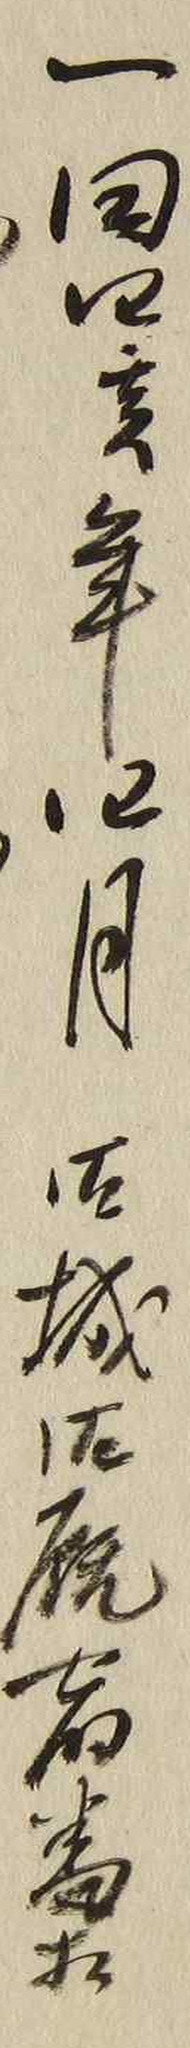一同四亥年四月御城御厩当番相
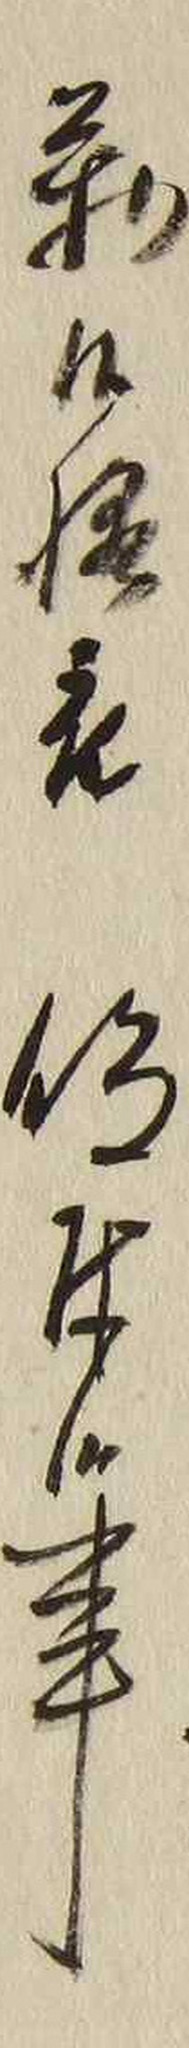勤候様被仰付候事
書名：諸士系譜　巻之360　す之部10
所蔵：会津若松市立会津図書館
